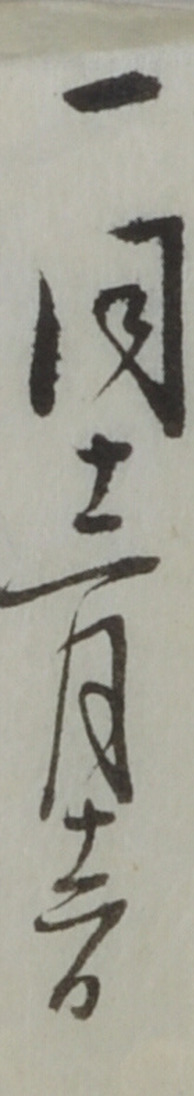一同十二月十二日
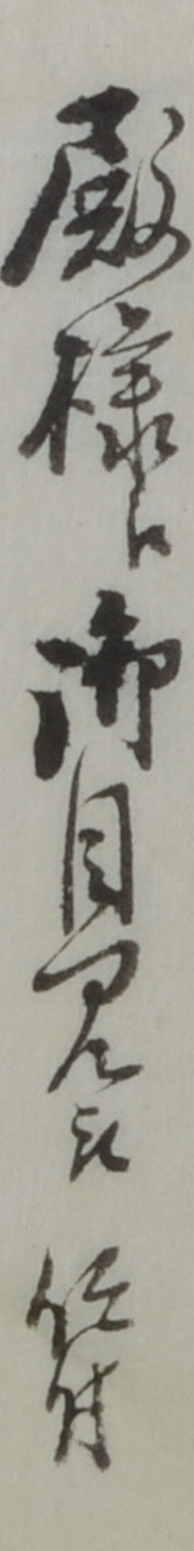殿様江御目見被仰付
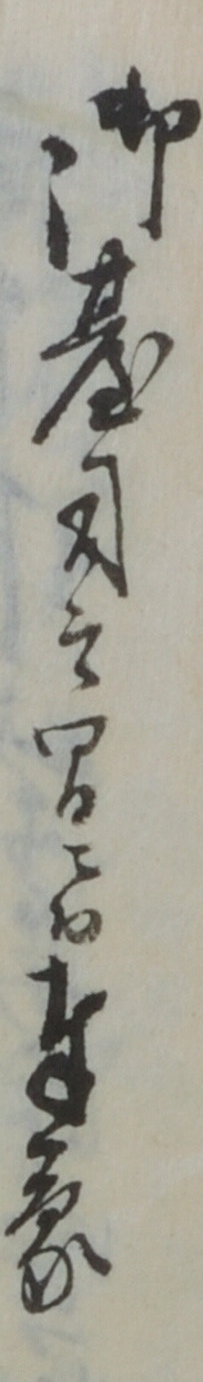御台司之間ニ而奉蒙
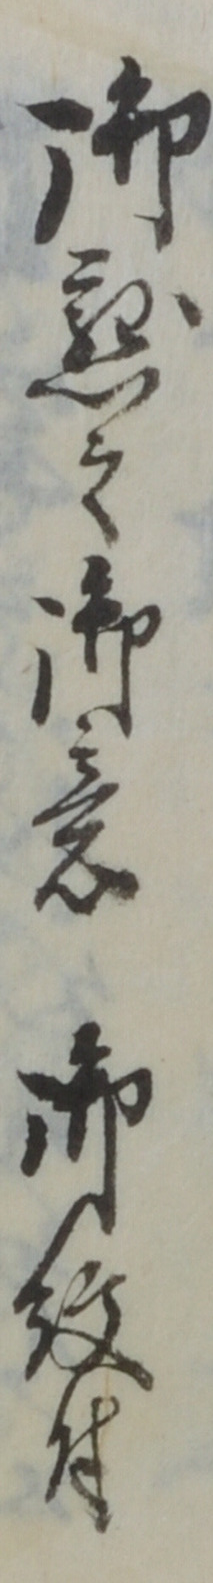御懸之御意御紋付
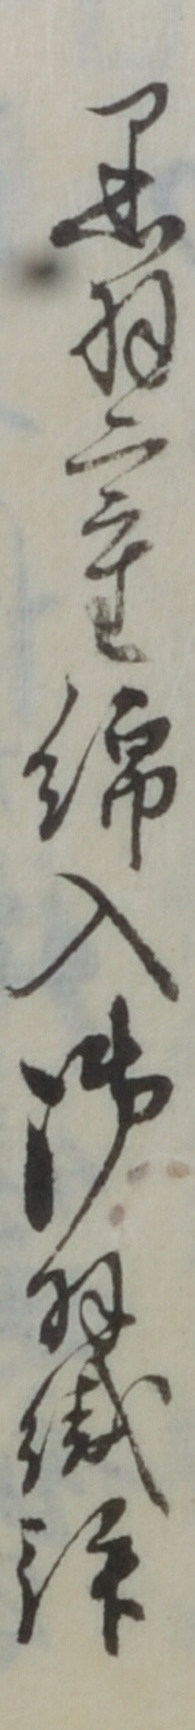黒羽二重綿入御羽織拝
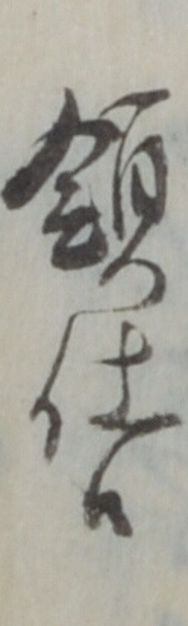領仕候

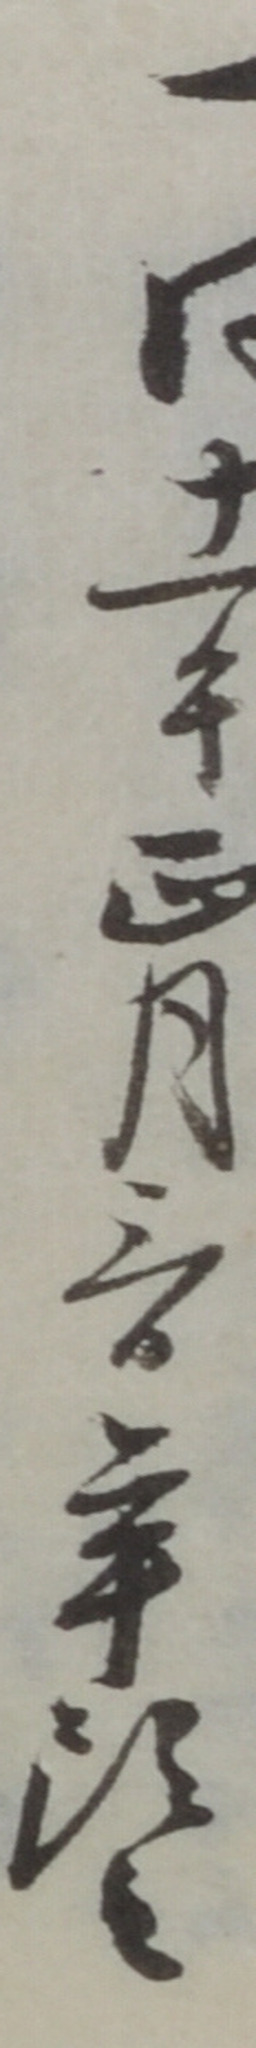一同十一年正月三日年頃之
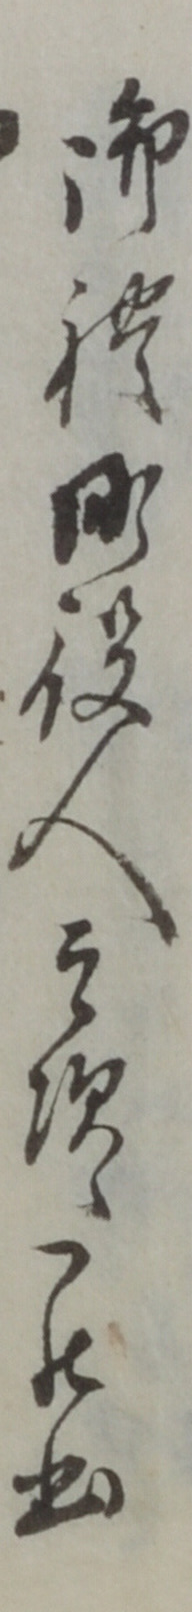御礼町役人之次ニ罷出
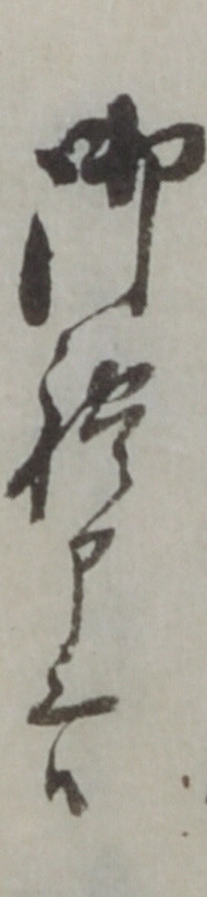御礼申上候
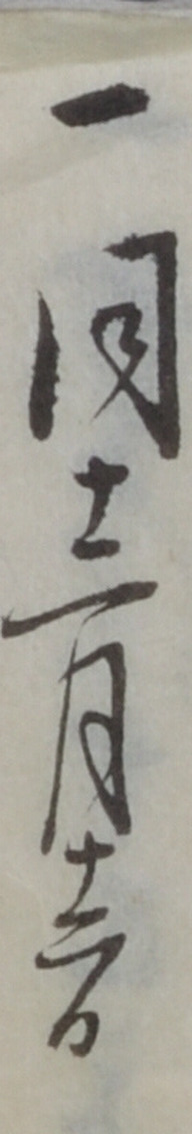一同十二月十二日
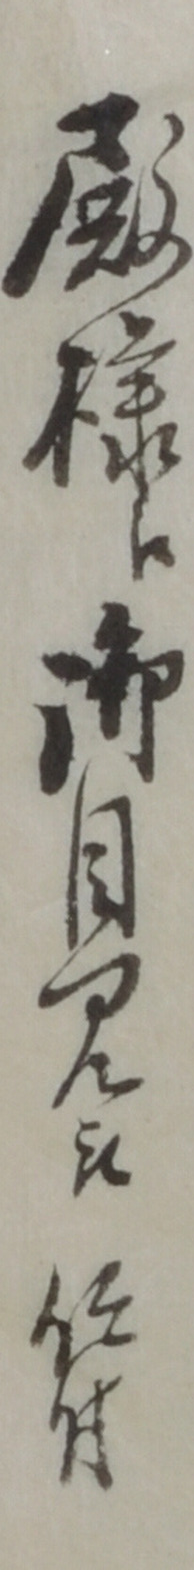殿様江御目見被仰付
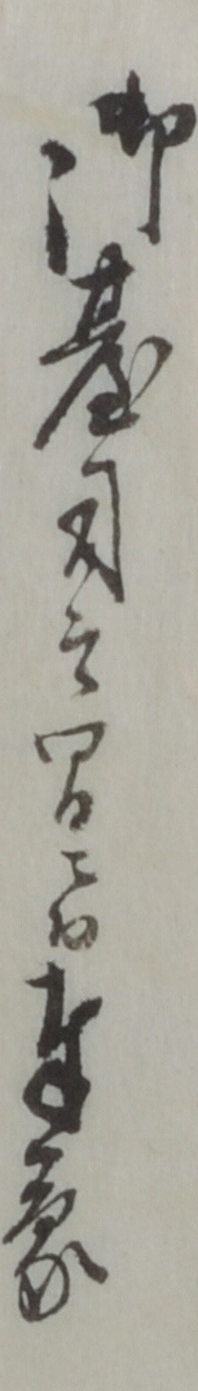御台司之間ニ而奉蒙
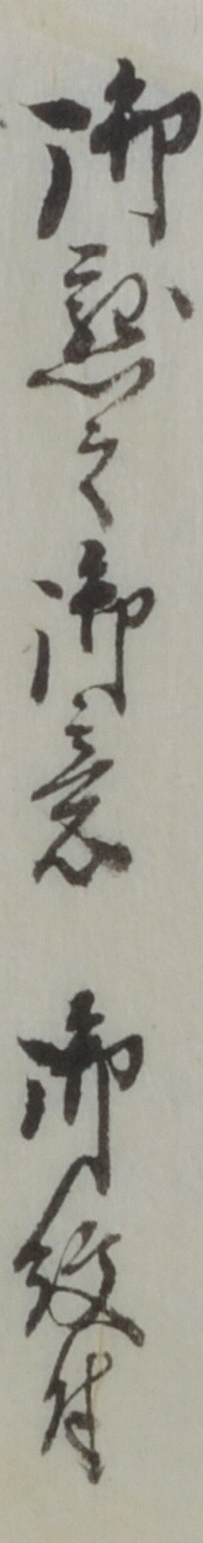御懸之御意御紋付
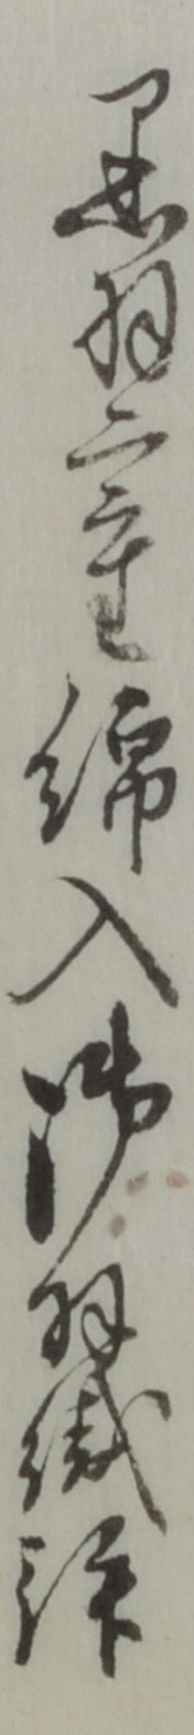黒羽二重綿入御羽織拝
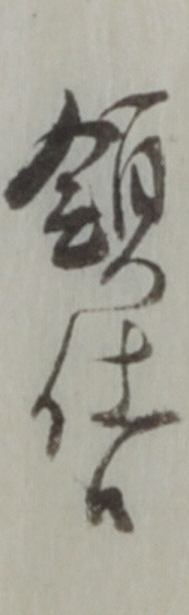領仕候
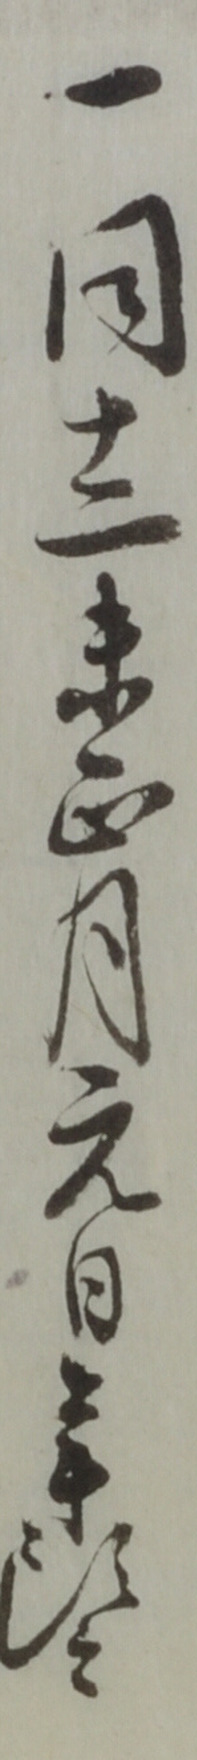一同十二未正月元日年頃ニ
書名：抜書
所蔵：伊那市立高遠町図書館・合同会社AMANE
